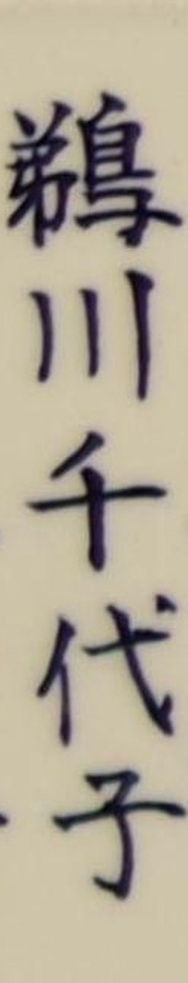鵜川千代子
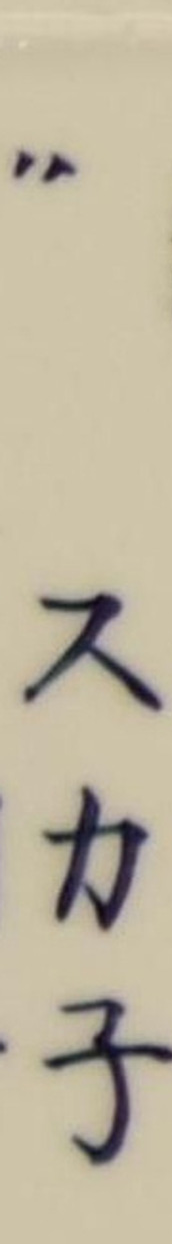スカ子
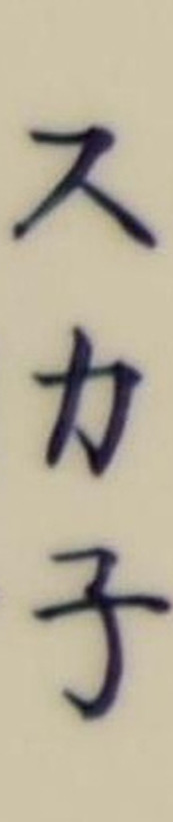スカ子
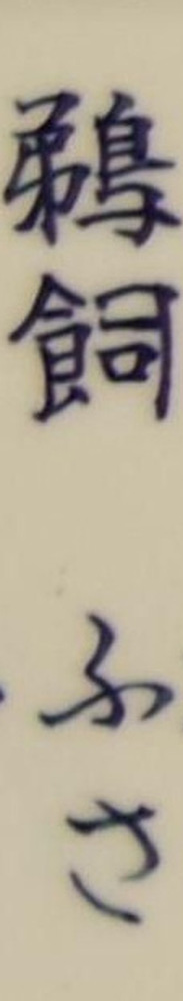鵜飼ふさ

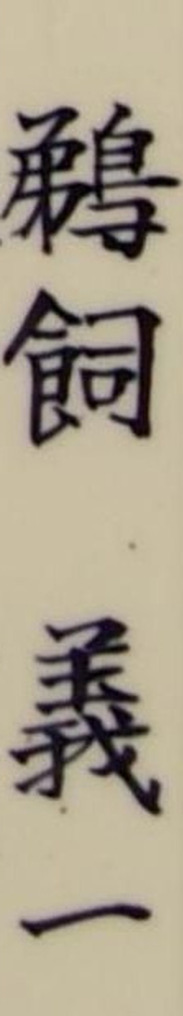鵜飼義一
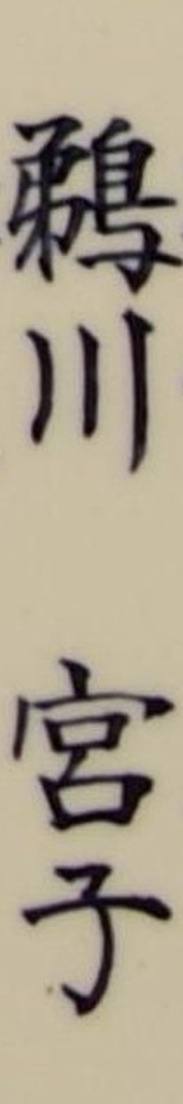鵜川宮子
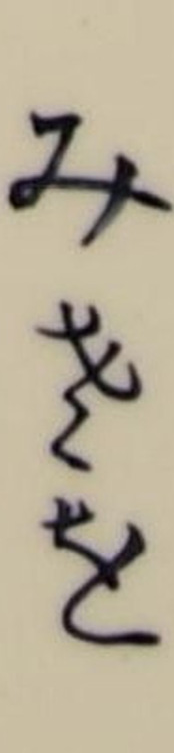みさを
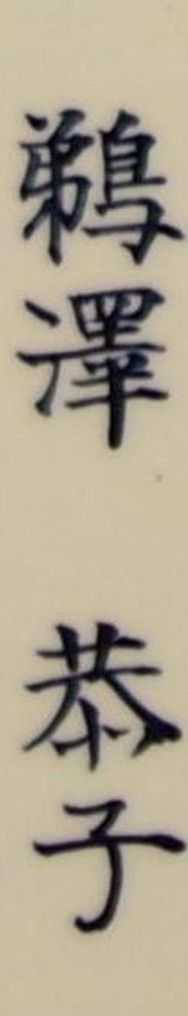鵜沢恭子
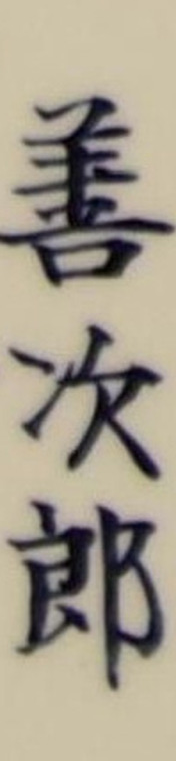善次郎
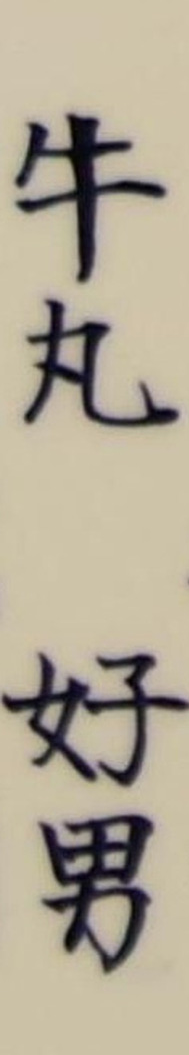牛丸好男
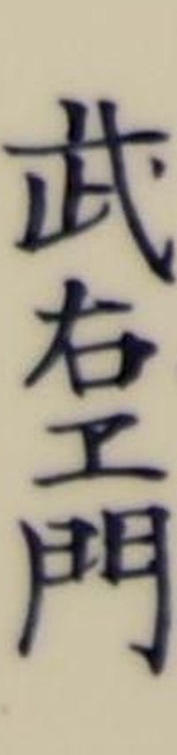武右エ門
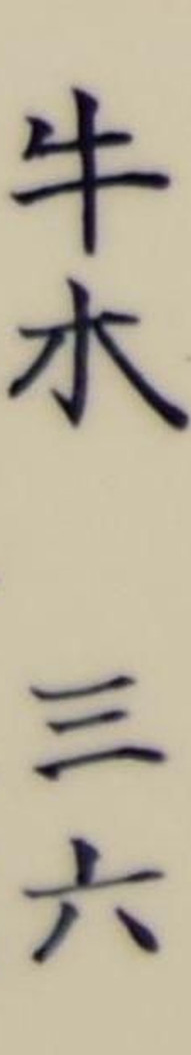牛木三六
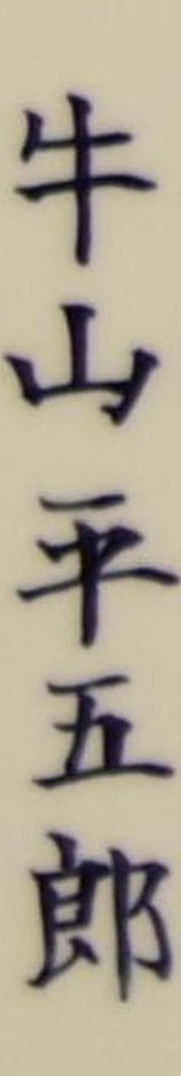牛山平五郎
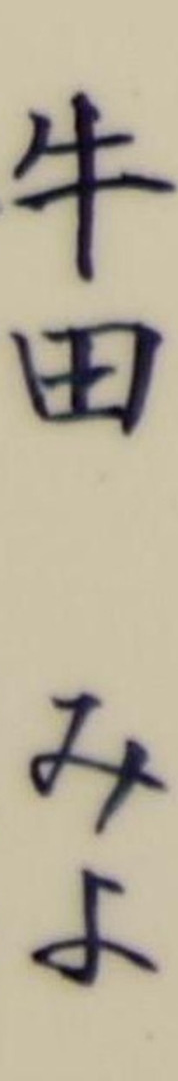牛田みよ
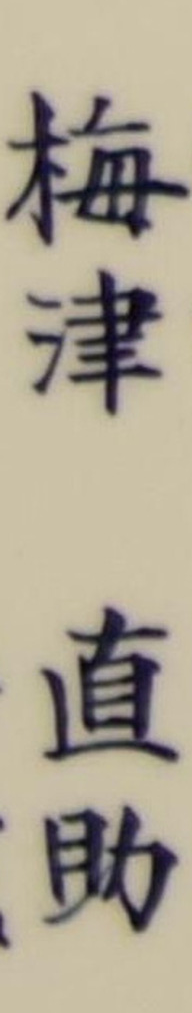梅津直助
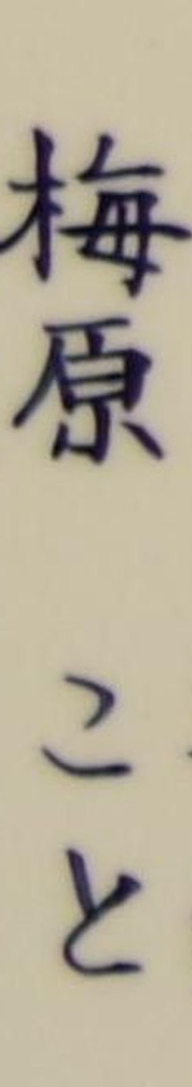梅原こと
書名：A~D
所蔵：koyasan kongobuji
